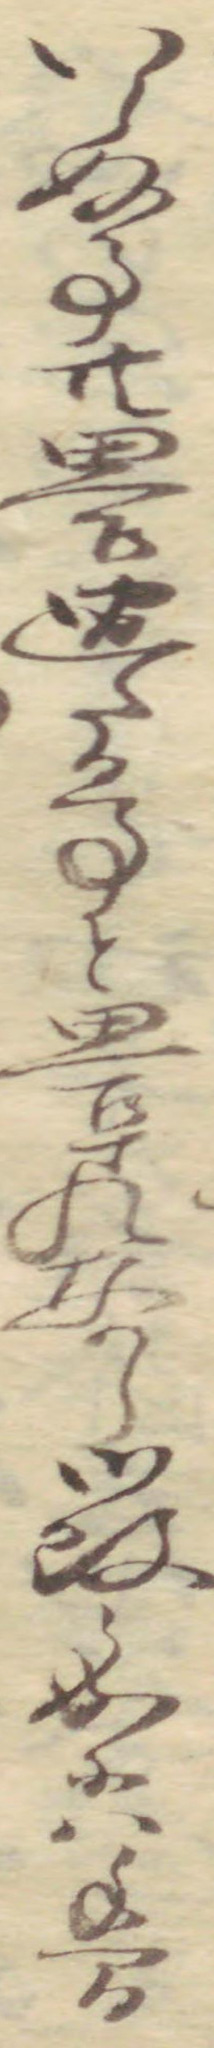いらぬ事とも思召過たる事と思召されなから御改被成には手間
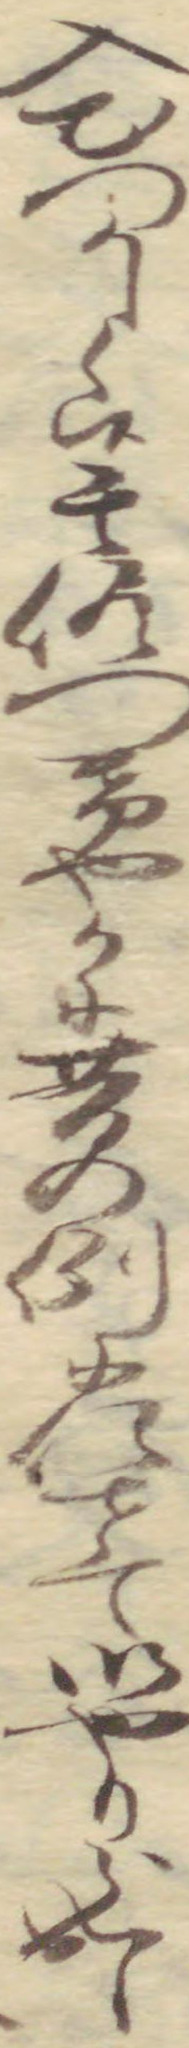入むつかしく候其侭つけやうに昔の例に任せて御やり被成候
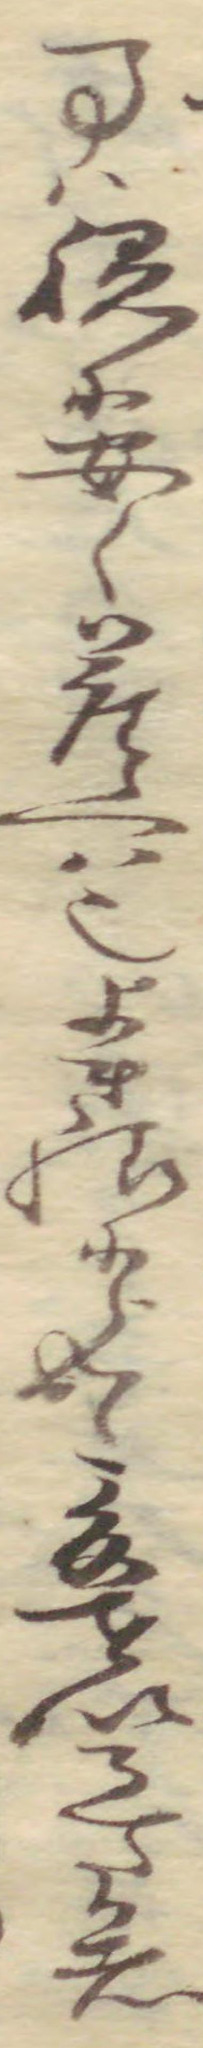事は穏に安く御座候へは也よき様に被成候爰を以過たる者
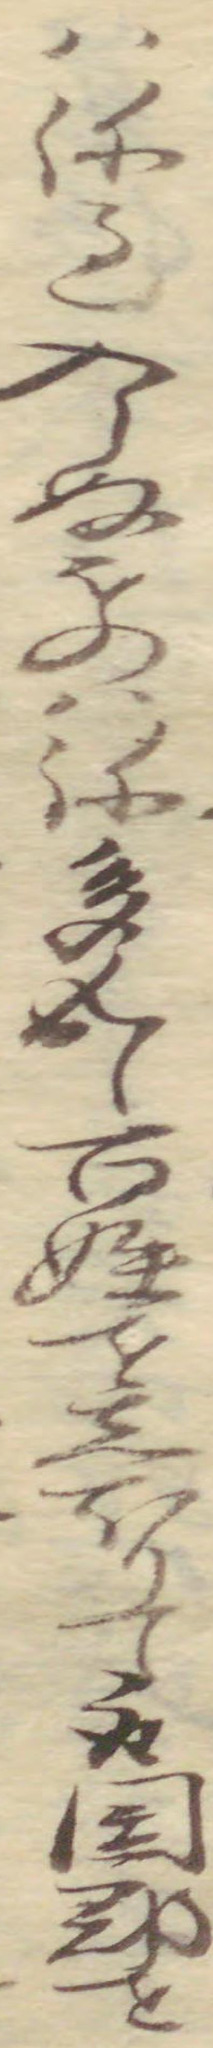は弥過入らぬものは弥多成候百姓をしほりて取国郡を
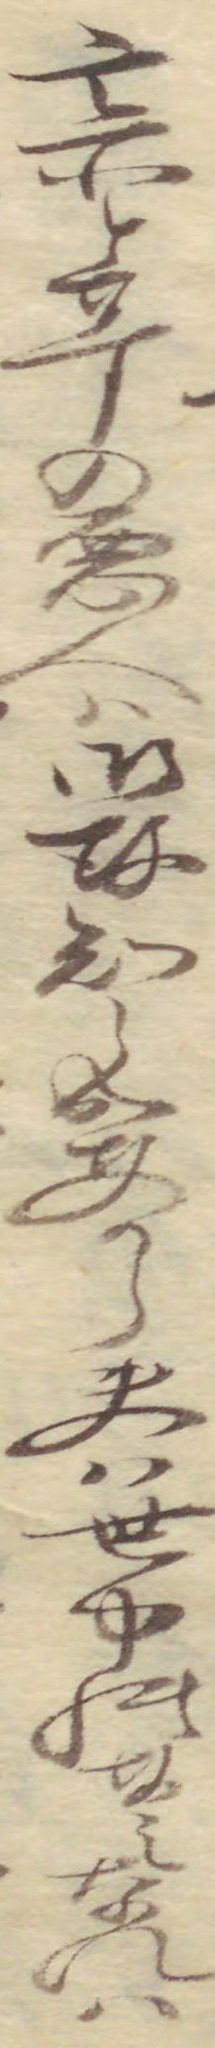亡所となすの悪人は御存知被成なから夫は世中のなみなれは
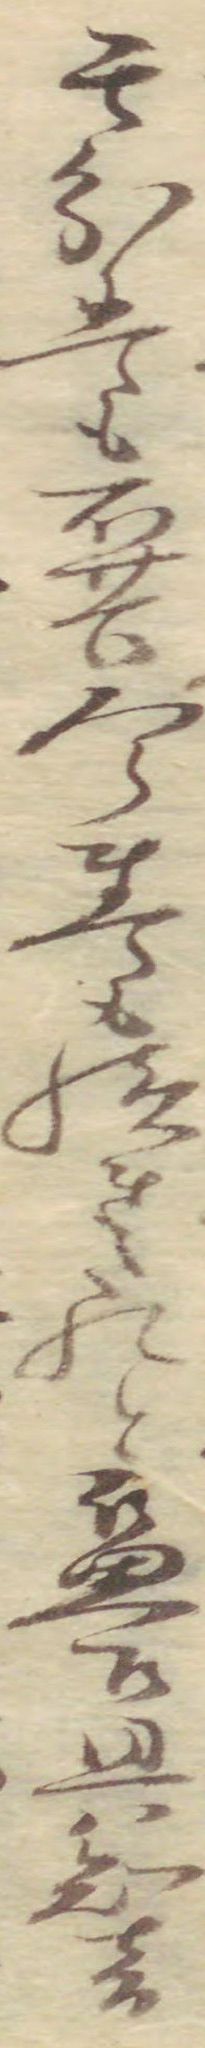其分にても不苦今まても続きたれと被思召且は知音
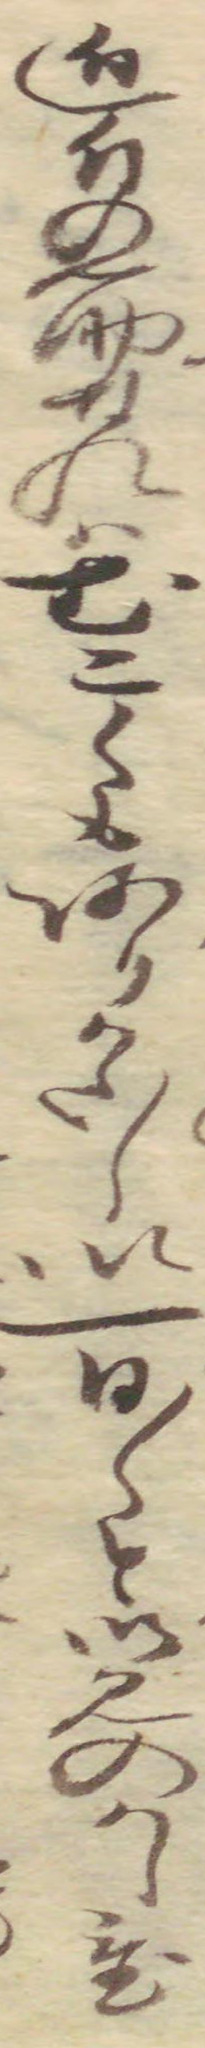近付の筋なれはむこくもありかたく以一日〳〵と御見のかし置
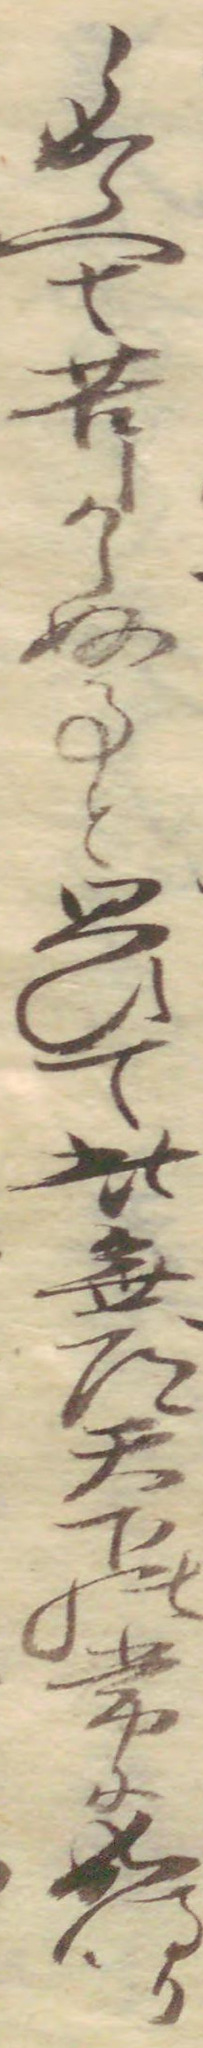被成候へは苦からぬ事と思ひて此無道天下の常に成侍り
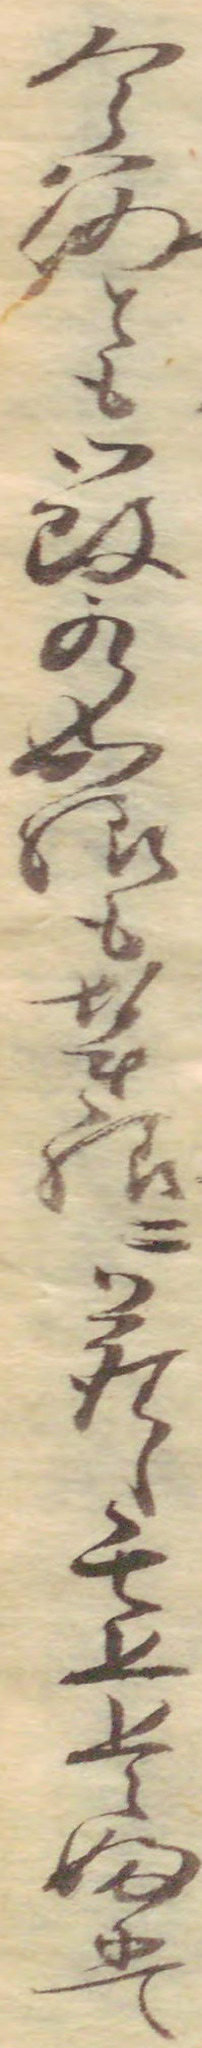今は何とも御改可被成様もなき様ニ御座候其上上〻ふにて

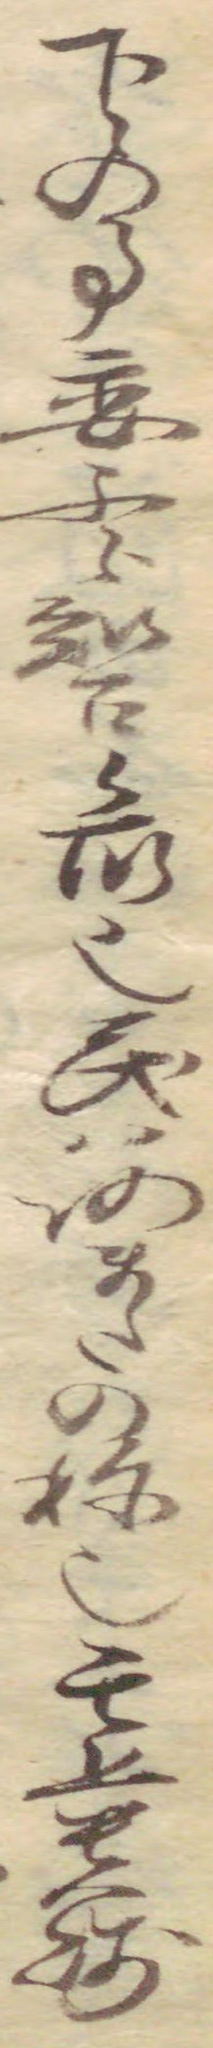下〻の事委不被知召候故也民はあまたの称也其上貴賤
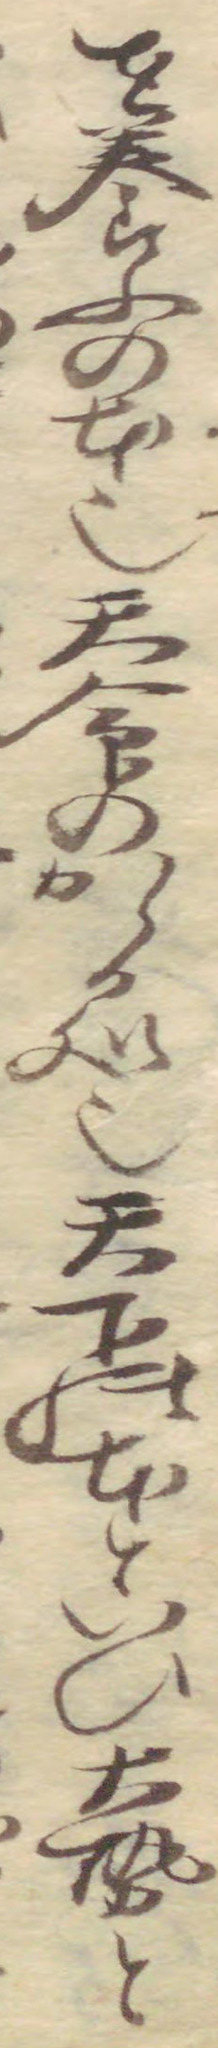を養ふの本也天命のかゝる処也天下の本といひ大勢と
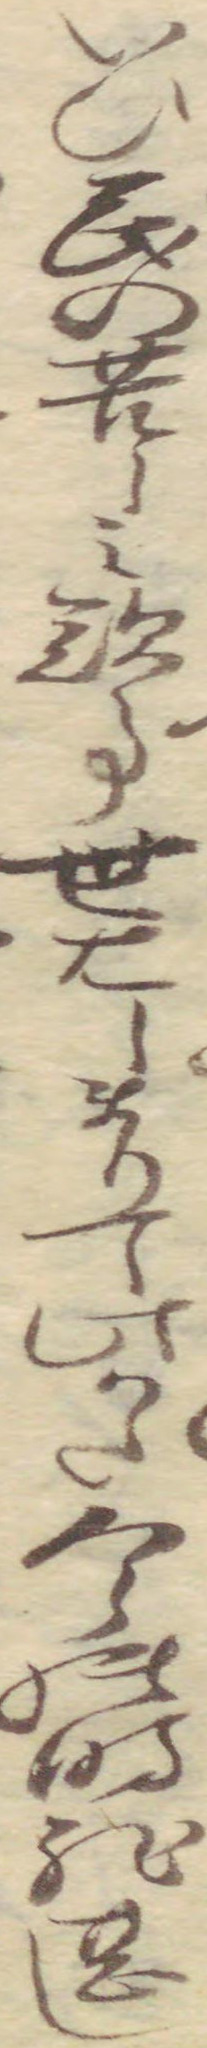いひ民の苦しみ歎事世はしまりて此かた今の時程甚し
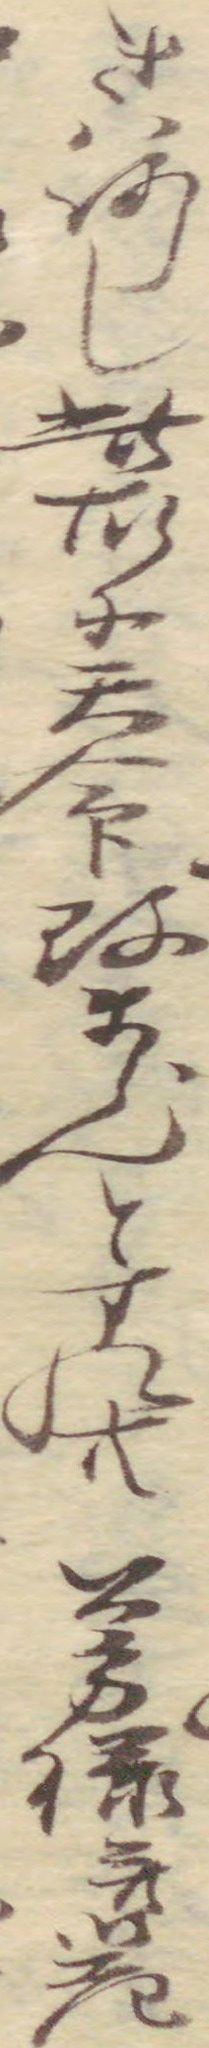きはあらし此故に天命改まらんとすれ共公方様并御老
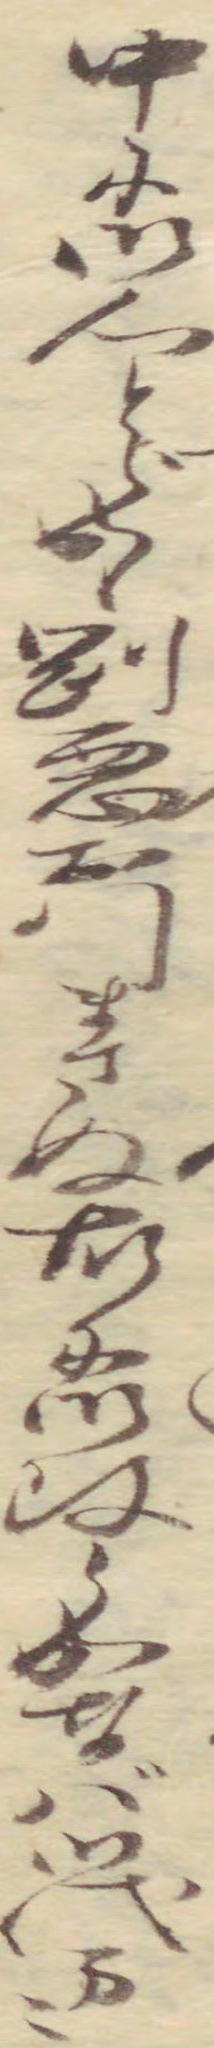中に御心と被成候剛悪おはしまさぬ故に御改被成なば御代万〻
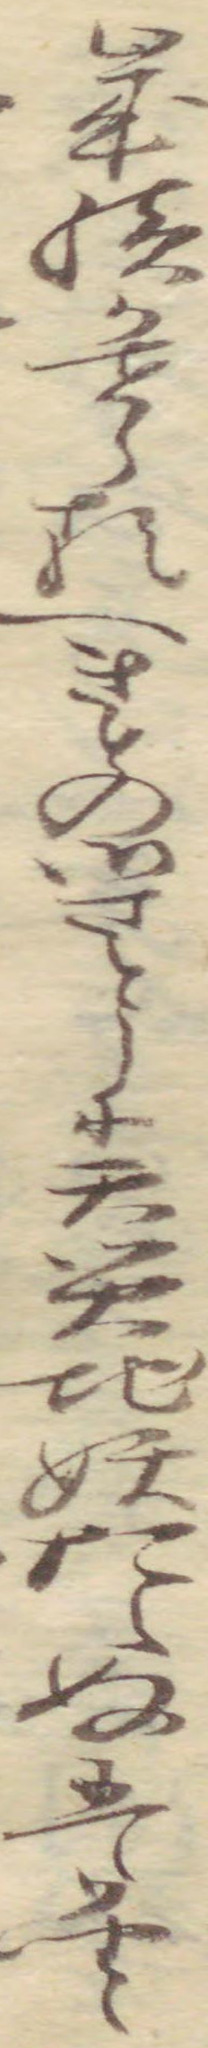歳続かせらるへきとの御さとしに天災地妖たえぬにて御座候
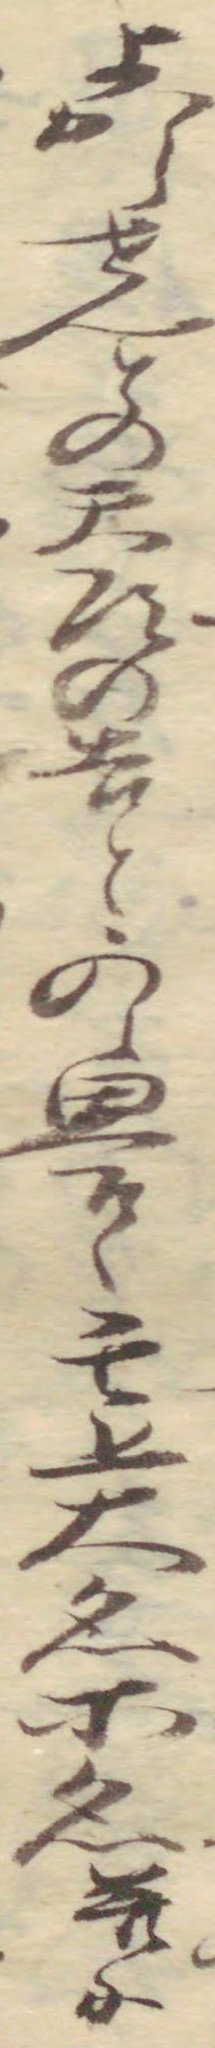よからせんとの天道の告と可被思召候其上大名等名并に
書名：鶯宿雑記. 巻263-264
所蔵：国立国会図書館 National Diet Library, JAPAN
